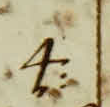4:
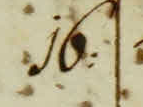16:
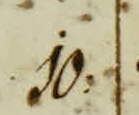10:
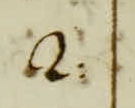2:
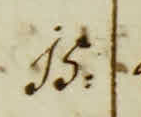15:
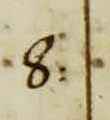8:
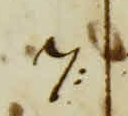7:
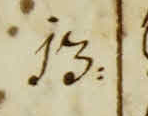13:
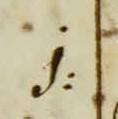1:
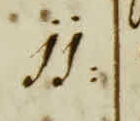11:
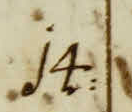14:
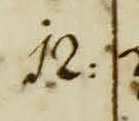12:
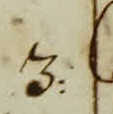3:
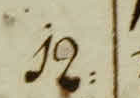12:
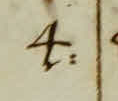4:
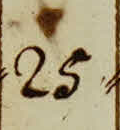25
